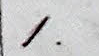1.
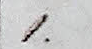1.
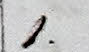1.
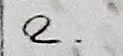2.
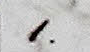1.
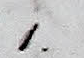1.
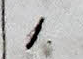1.
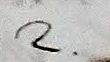2.
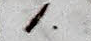1.
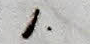1.
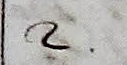2.
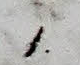1.
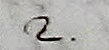2.
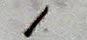1.
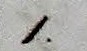1.
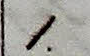1.
